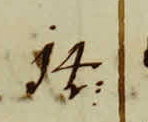14:
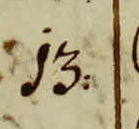13:
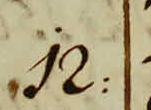12:
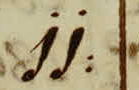11:
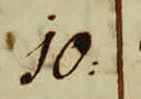10:
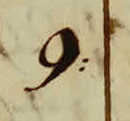9:
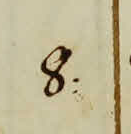8:
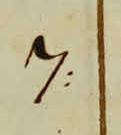7:
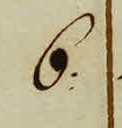6:
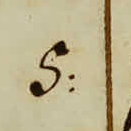5:
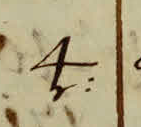4:
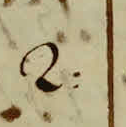2:
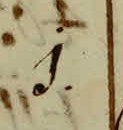1.
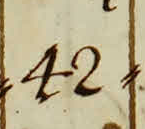42
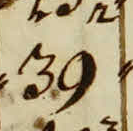39
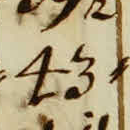43
